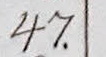47.
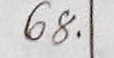68.
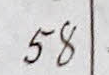58
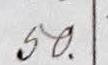50.
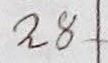28
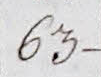63
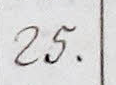25.
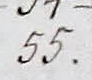55
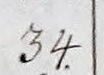34.
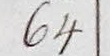64
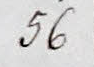56
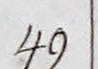49
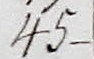45
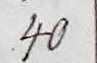40
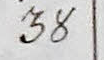38
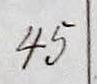45
